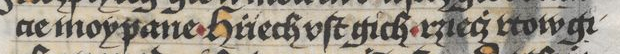cie moy pane.Hṙiech vſt gich.rziecż rtow gi¬
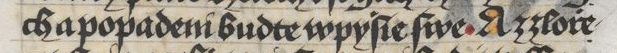ch a popadeni budte wpyẛie ſwe.A z zloṙe¬
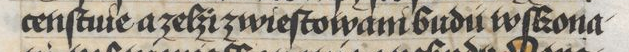cenſtuie a zelżi zwieſtowani budú w ſkona¬
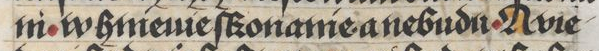ni.w hníeuíe ſkonaníe.a nebudu.A vie¬
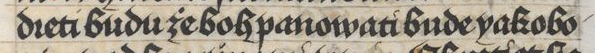dieti budu że boh panowati bude yakobo¬
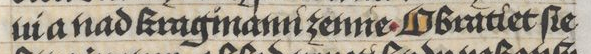ui a nad kraginami zemie.Obratiet ſie
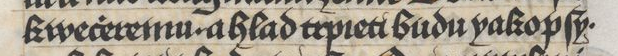kweċeremu. a hlad trpieti budu yakopſy.
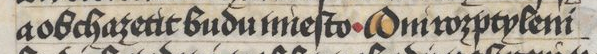a obchazetit budu mieſto.Oni rozptylení
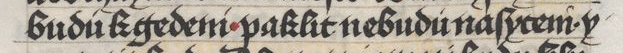budú k gedení.paklit nebudú naſyceni.y¬
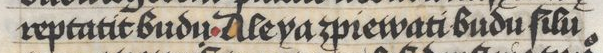reptatit budu.Ale ya zpiewati budu ſilu
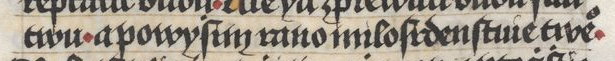twu.a powyẛim rano miloſrdenſtuie tweo.
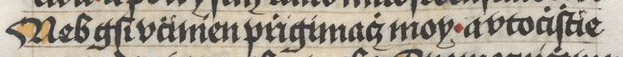Neb gſi vċinien pṙigimacż moy.a vtoċiẛtie
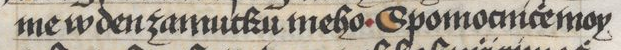me w den zamutku meho.Spomocníċe moy
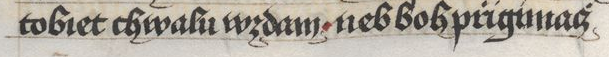tobiet chwalu wzdam.neb boh pṙigimacż
